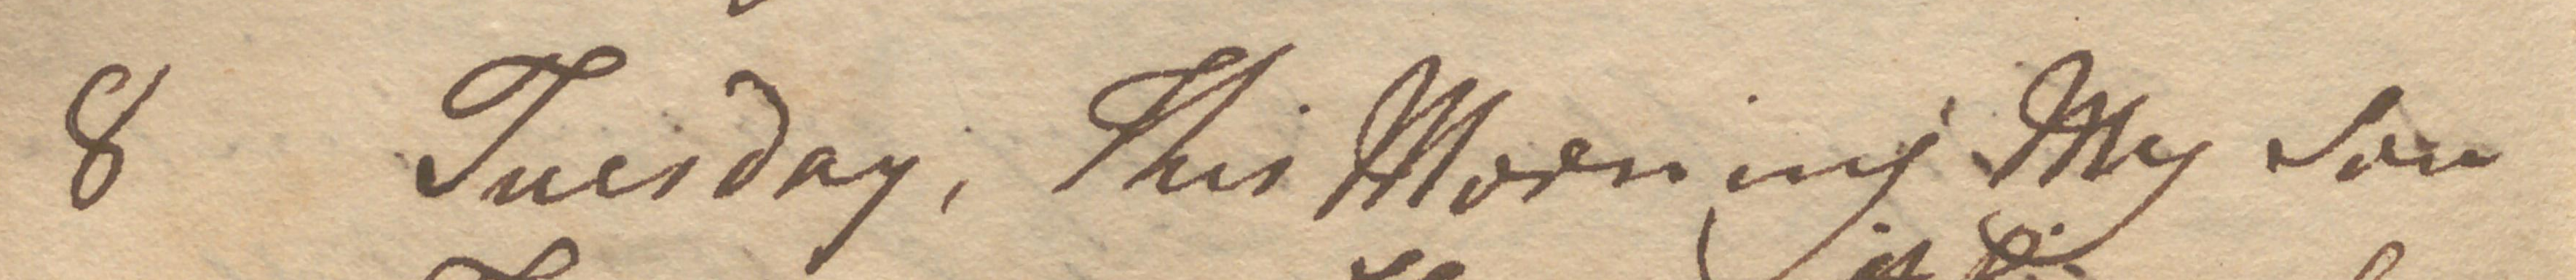8 Tuesday, This Morning My Son
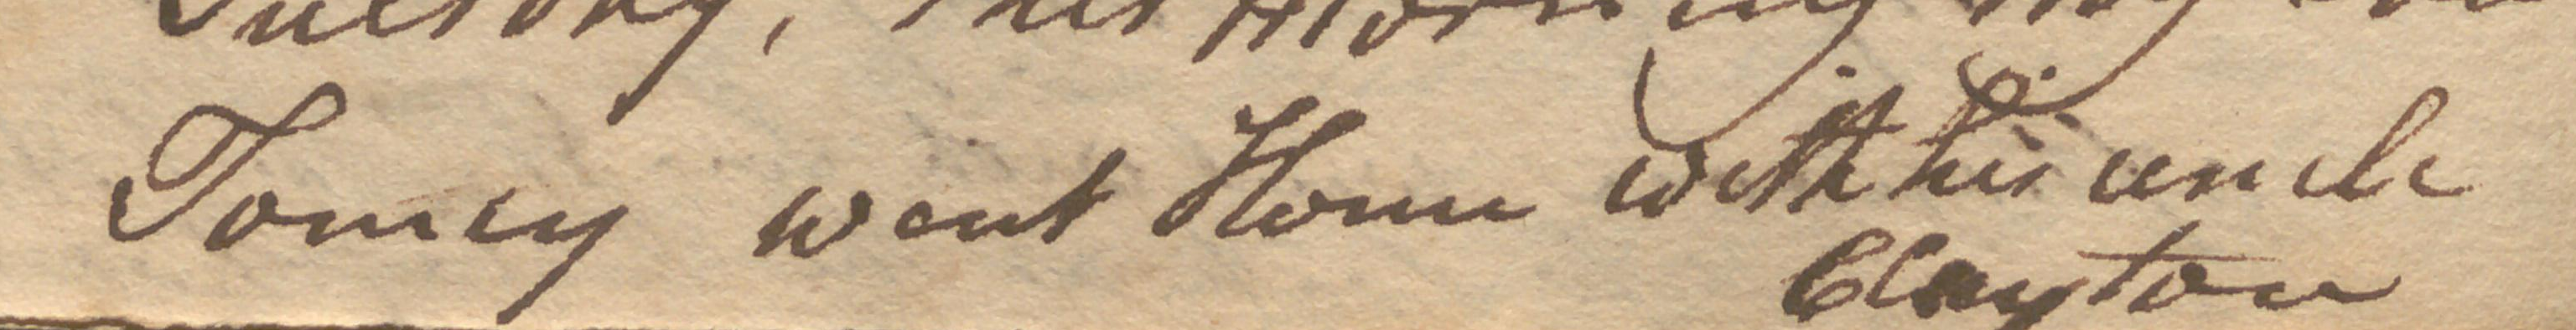Tomey went Home with his uncle
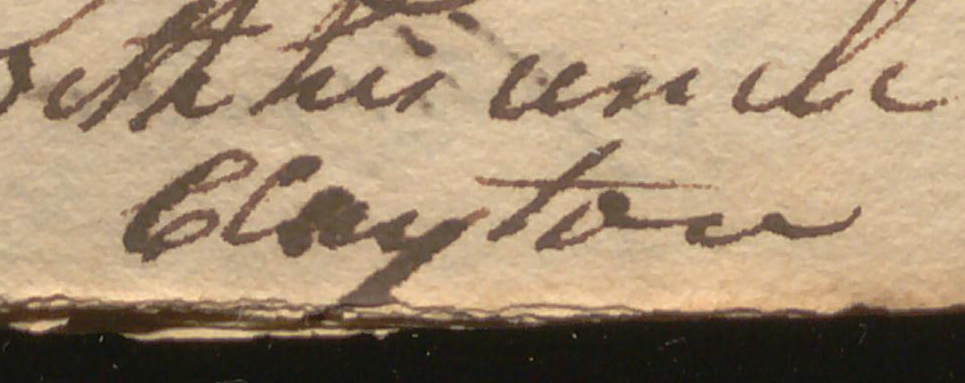Clayton
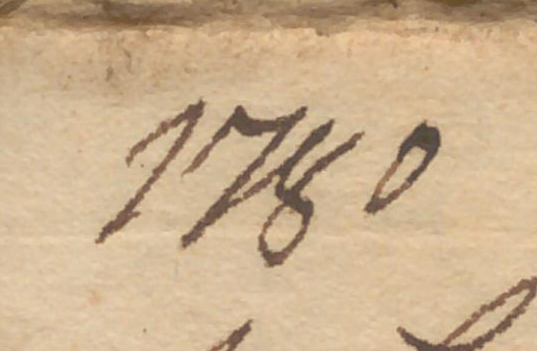1780
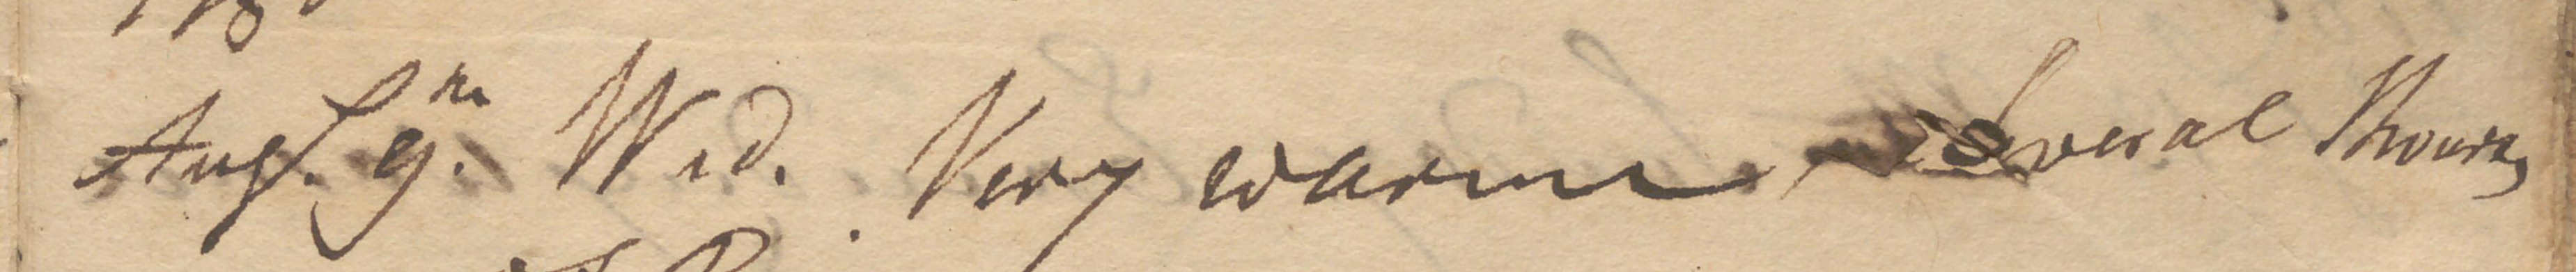Aug^t. 9^th. Wed. Very warme, several shoures
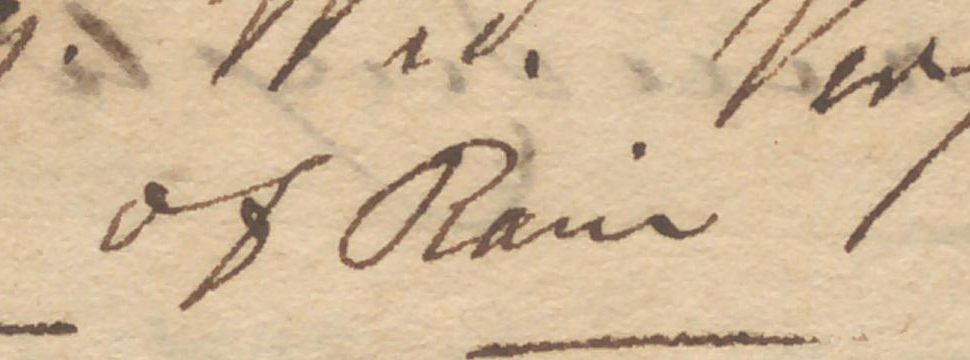of Rain
